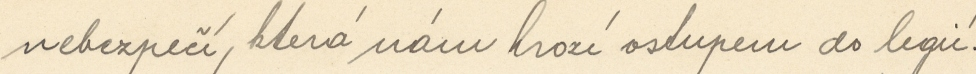nebezpečí, která nám hrozí vstupem do legií.
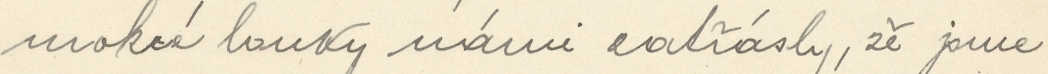mokré louky námi zatřásly, že jsme
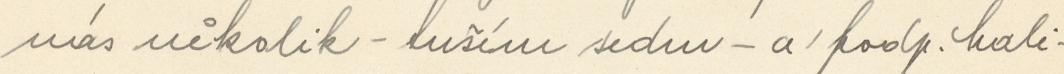nás několik - tuším sedm - a podp. Mali-
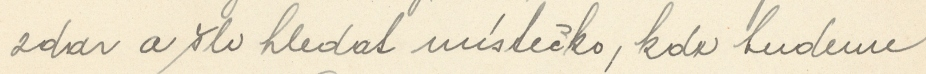zdar a šli hledat místečko, kde budeme
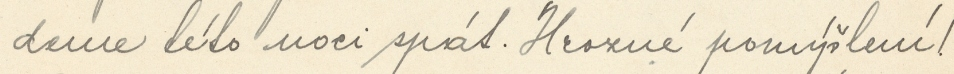deme této noci spát. Hrozné pomýšlení!
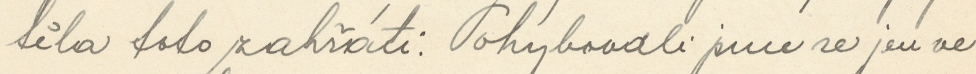těla toto zahřáti. Pohybovali jsme se jen ve
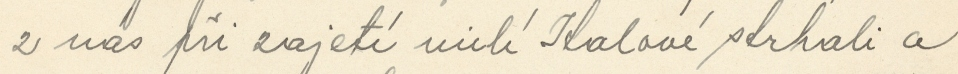z nás při zajetí milí Italové strhali a
